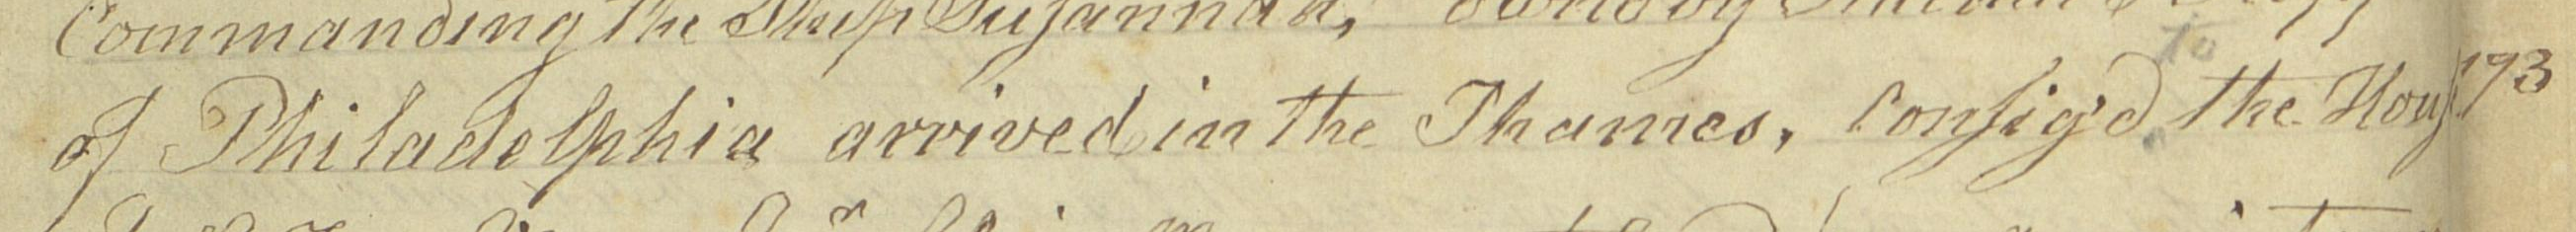of Philadelphia arrived in the Thames, consig'd the Hous-
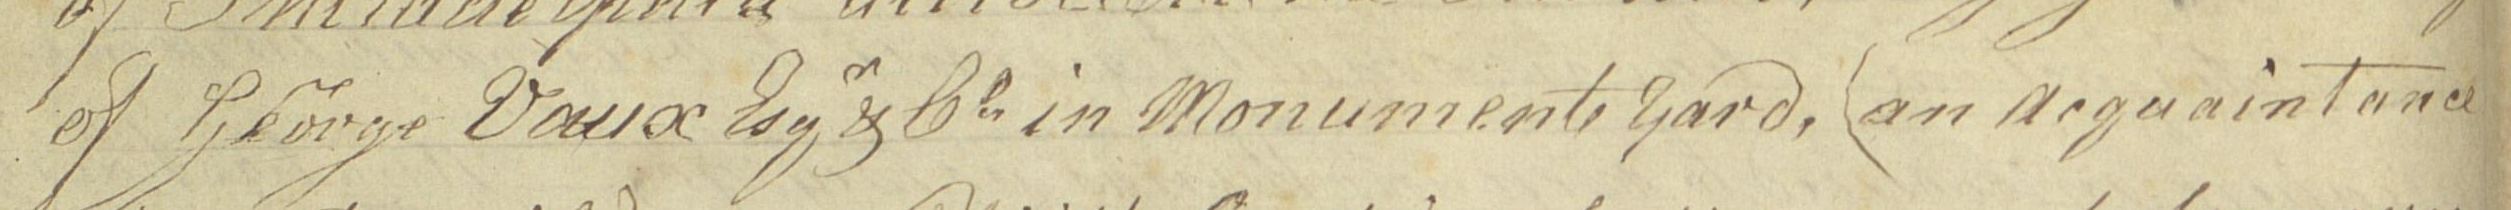of George Vaux Esq^r & C^o. in Monuments yard, (an acquaintance
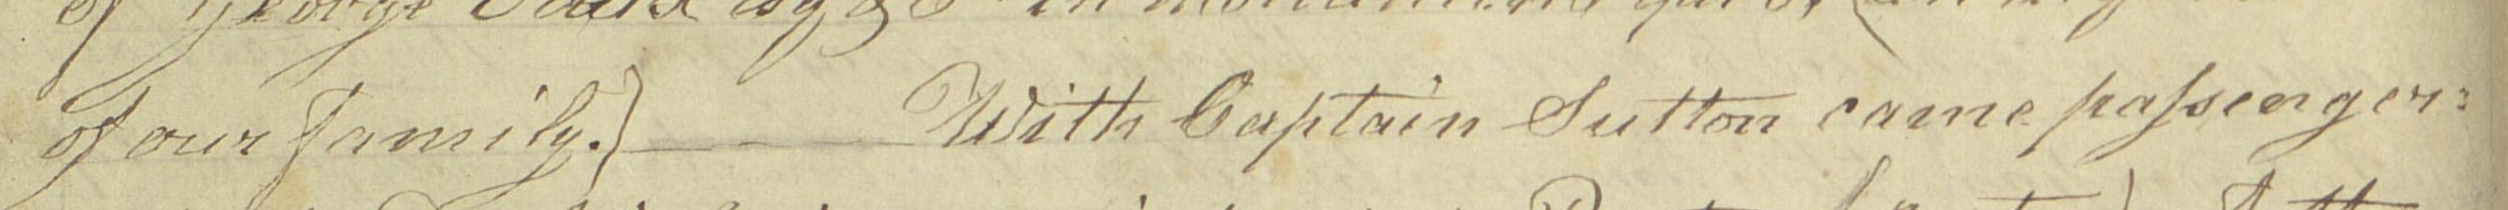of our family.) With Captain Sutton came passenger:
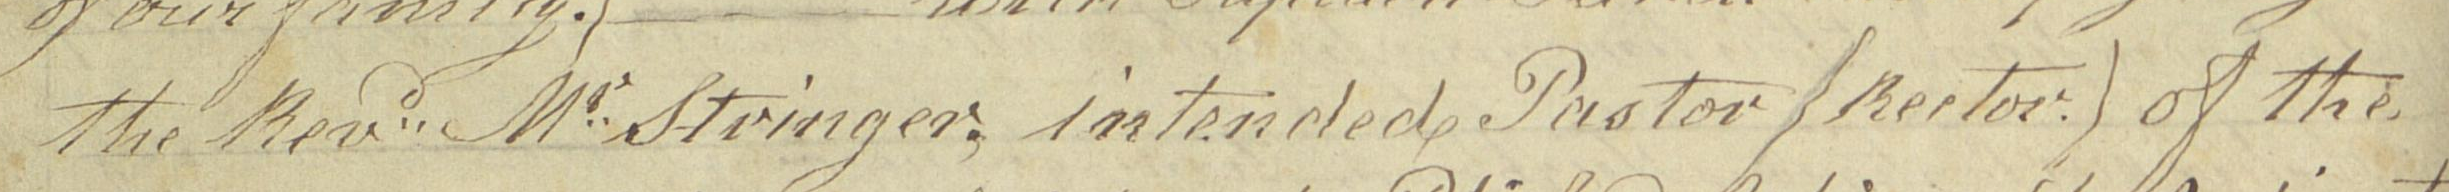the Rev^d. M^r. Stringer, intended Pastor/Rector.) of the
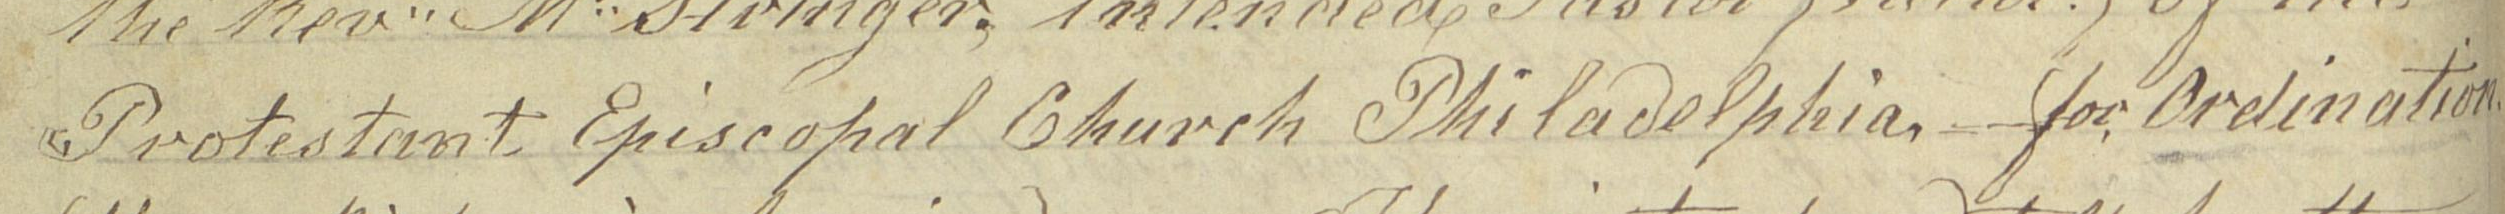Protestant Episcopal Church Philadelphia, for Ordination
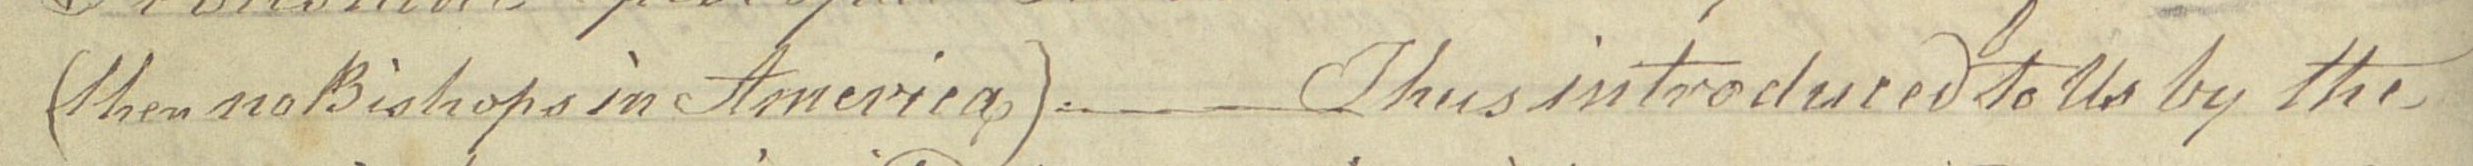(then no Bishops in America) Thus introduced to Us by the
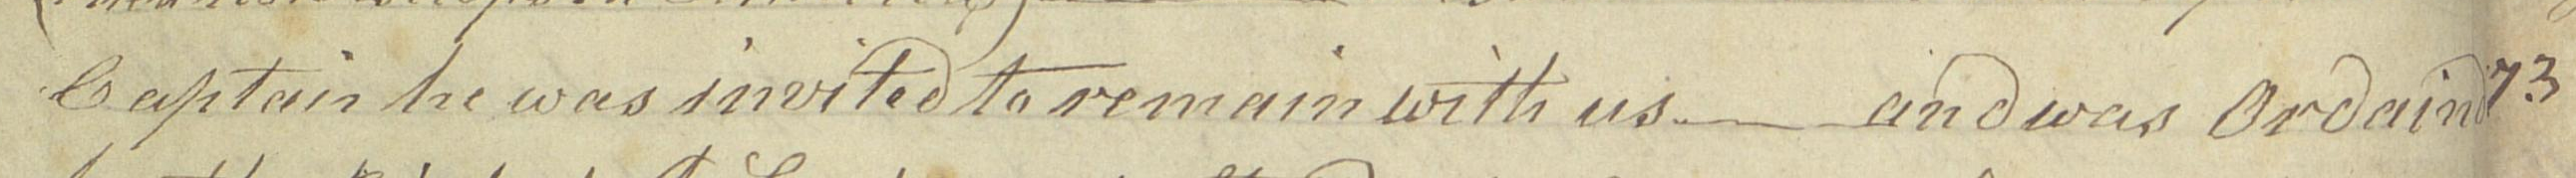Captain he was invited to remain with us, and was Ordaind
